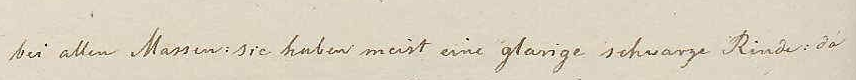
bei allen Massen: sie haben meist eine glasige schwarze Rinde: da
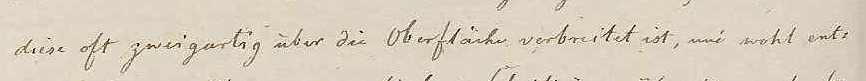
diese oft zweigartig über die Oberfläche verbreitet ist, und wohl ent-
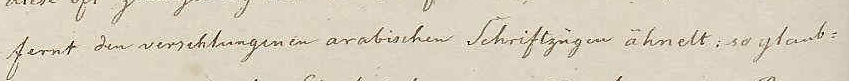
fernt den verschlungenen arabischen Schriftzügen ähnelt: so glaub-
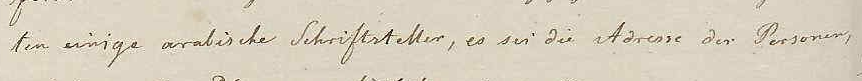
ten einige arabische Schriftsteller, es sei die Adresse der Personen,
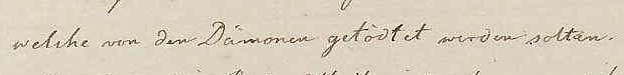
welche von den Dämonen getödtet werden solten.
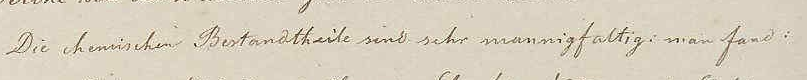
Die chemischen Bestandtheile sind sehr mannigfaltig: man fand:
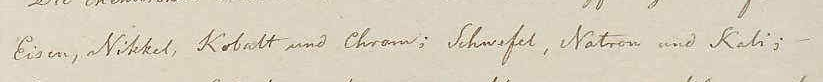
Eisen, Nikkel, Kobalt und Chrom; Schwefel, Natron und Kali; –
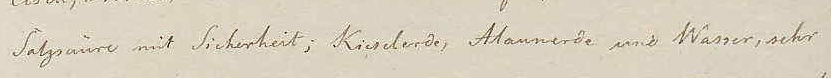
Salzsäure mit Sicherheit; Kieselerde, Alaunerde und Wasser, sehr
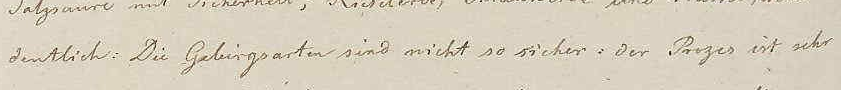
deutlich: Die Gebirgsarten sind nicht so sicher: der Prozes ist sehr
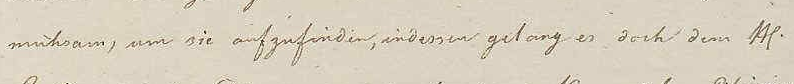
mühsam, um sie aufzufinden, indessen gelang es doch dem H￼.
